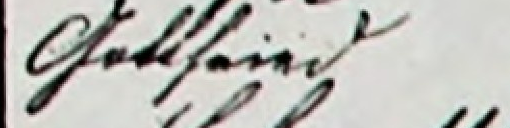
Gottfried
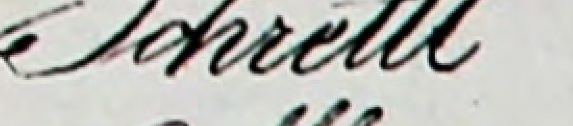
Schrettl
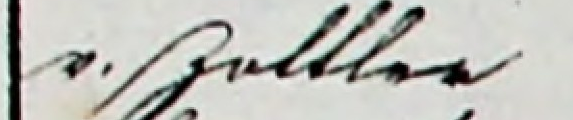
v. Zottler
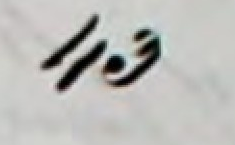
43
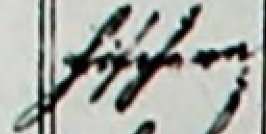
Fischern„
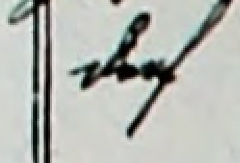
dorf
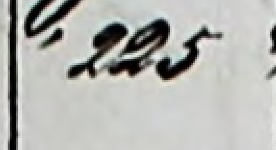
0,225
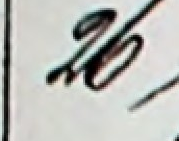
26
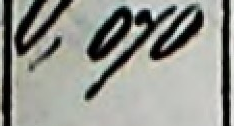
0,070
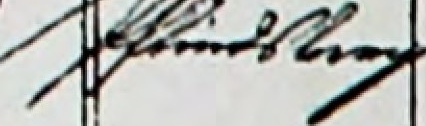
Pflindsberg
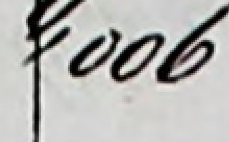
0,006
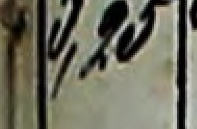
3,25
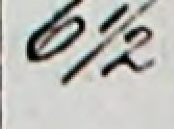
6 ½
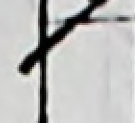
7
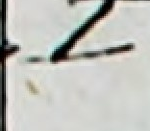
I
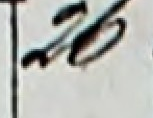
26
